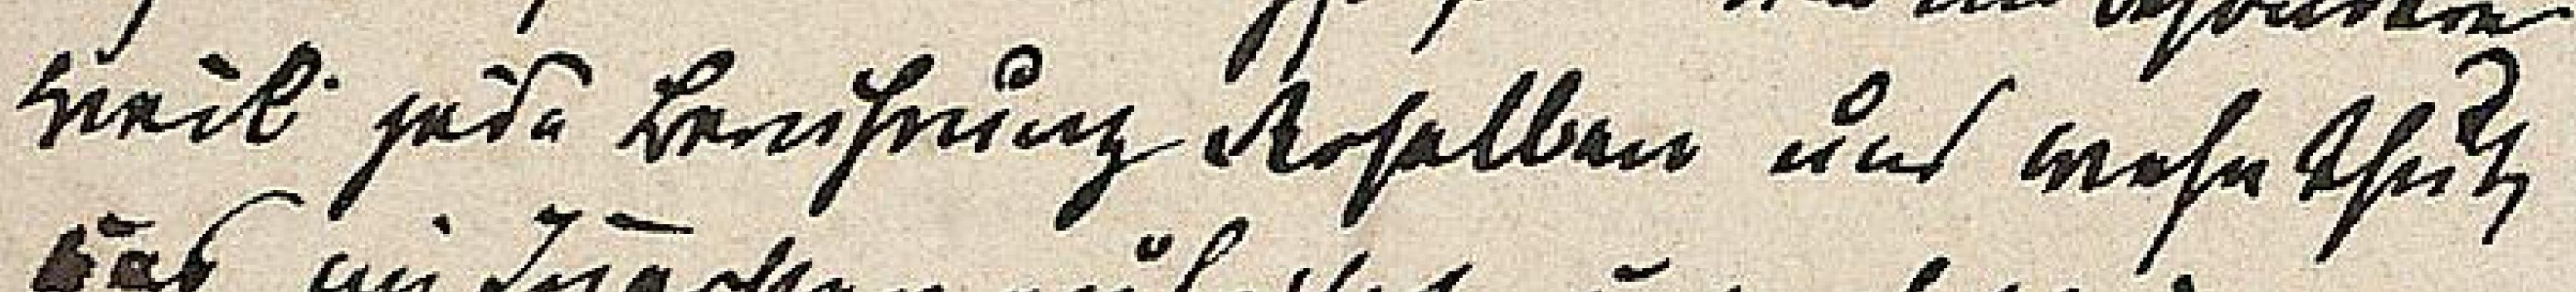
weil jede Berührung derselben uns wehe thut,
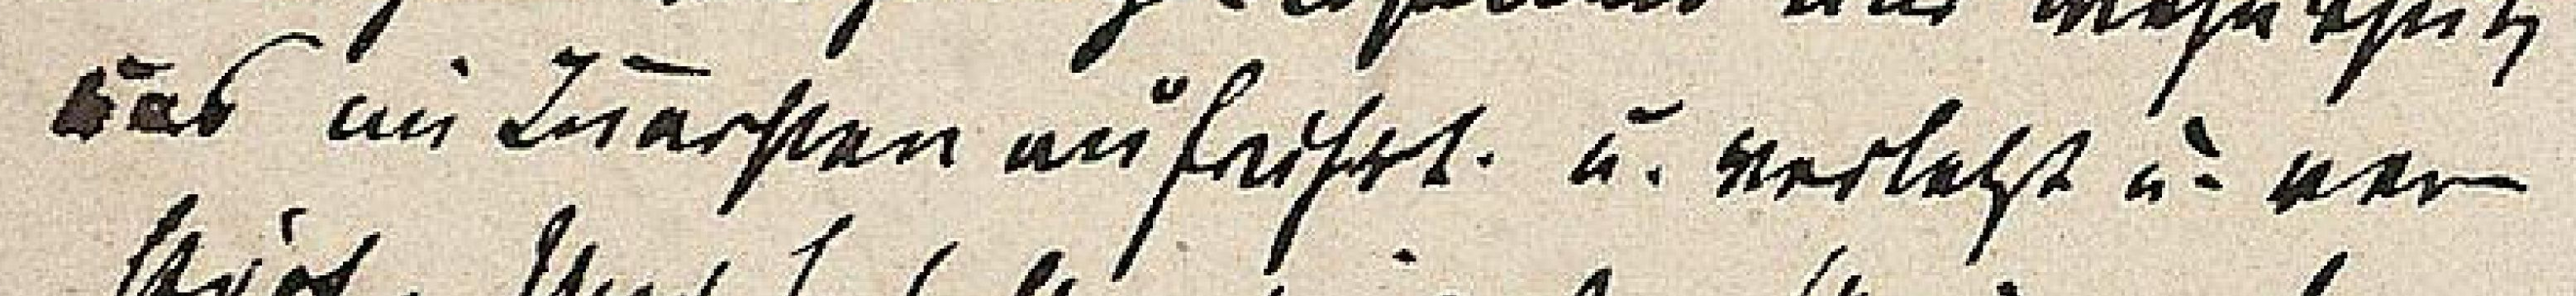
uns, im Innersten aufrührt u. verletzt u. ver¬
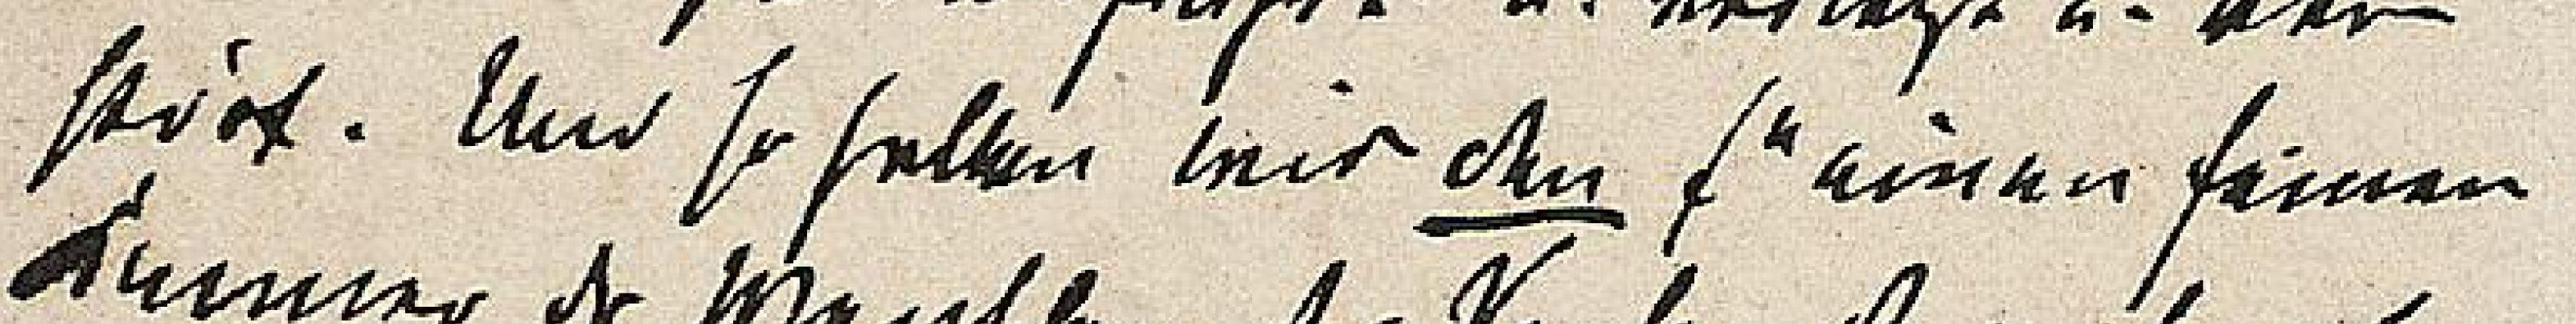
stört. Und so halten wir den fü einen feinen
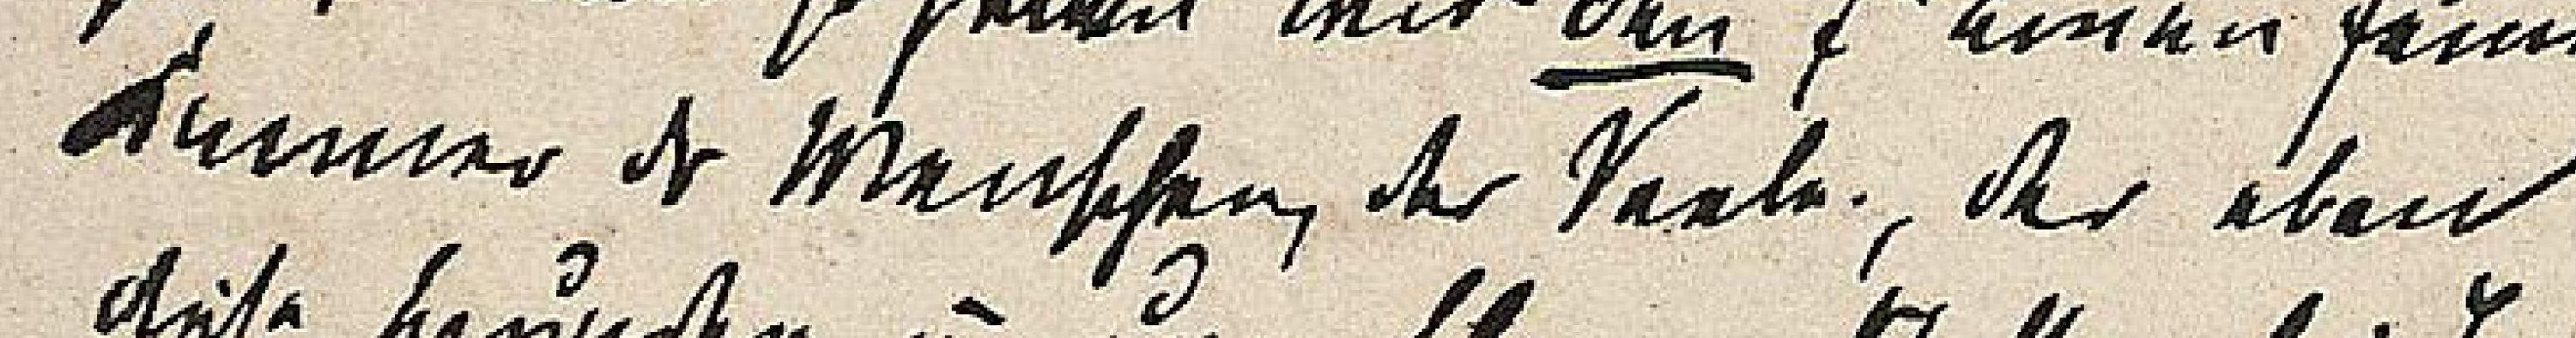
Kenner dr Menschen, der Seele, der eben
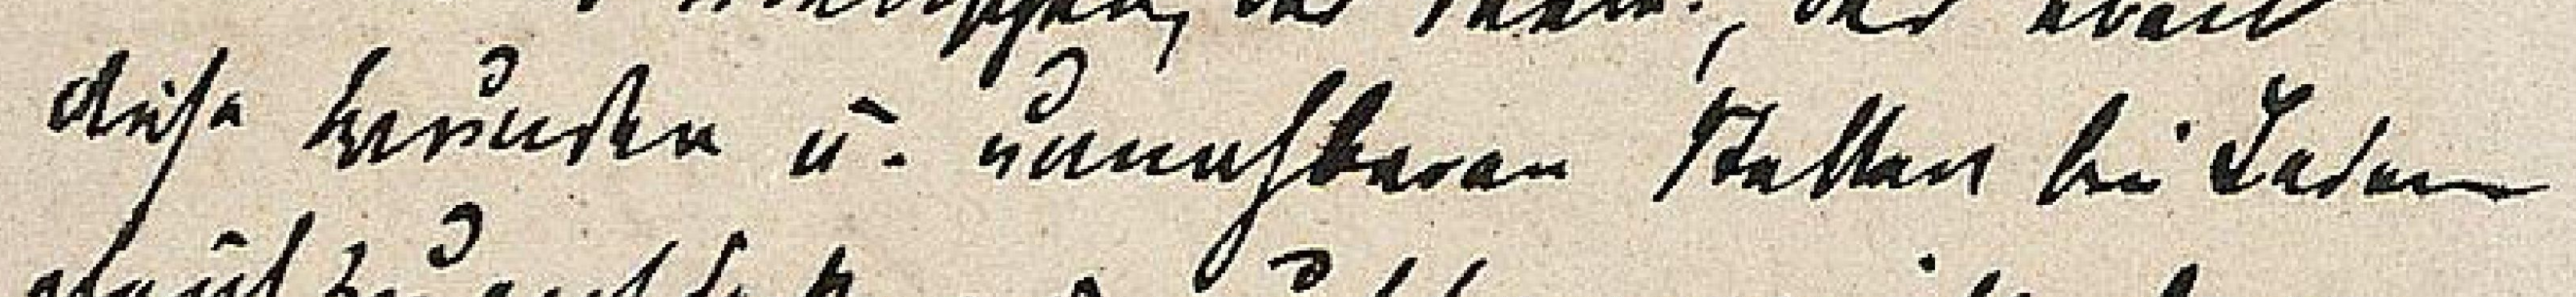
diese Wunden u. unnahbaren Stellen bei Jedem
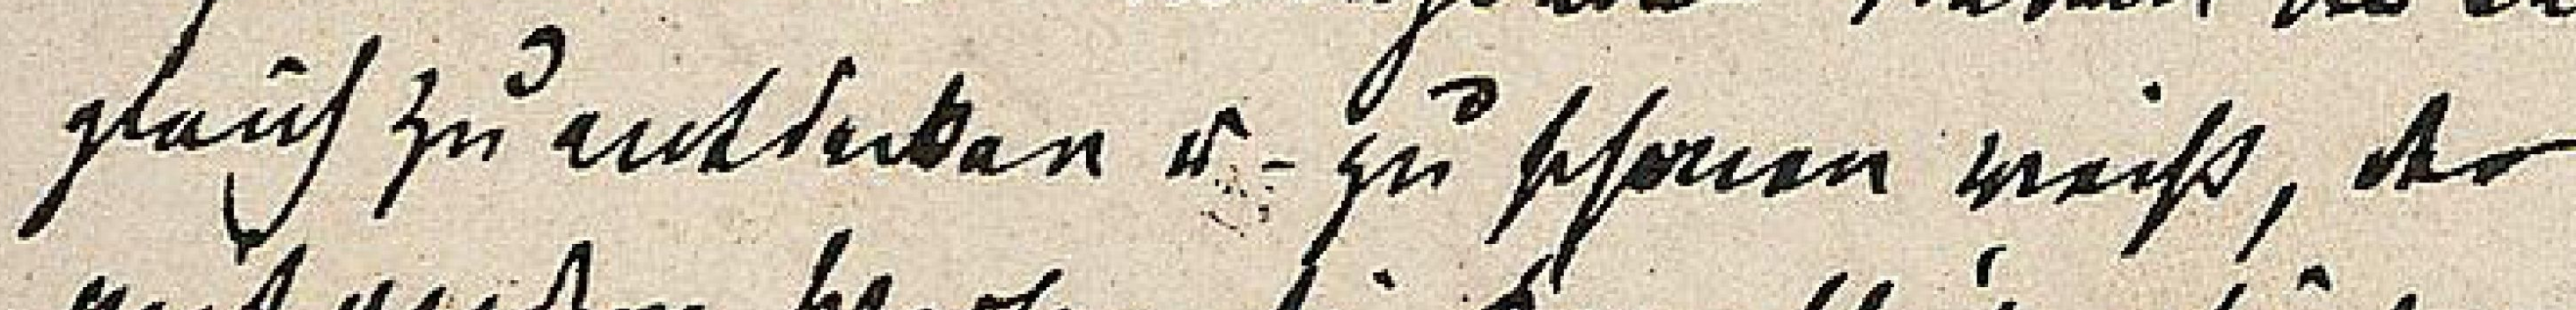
gleich zu entdecken u. zu schonen weiß, der
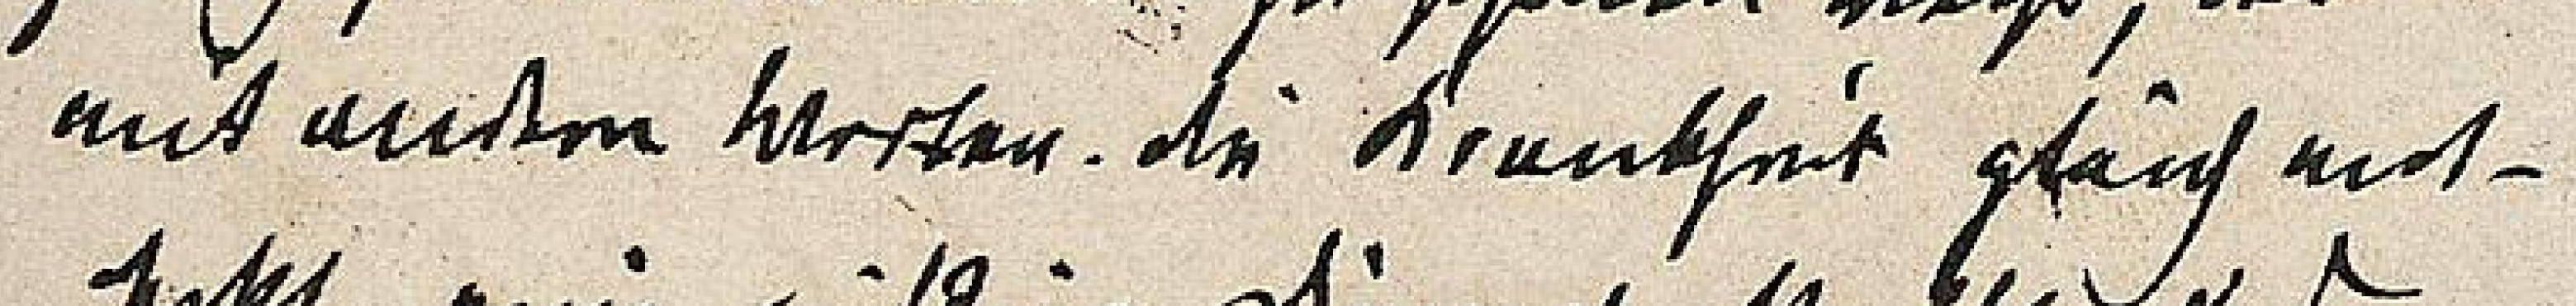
mit andern Worten. die Krankheit gleich ent¬
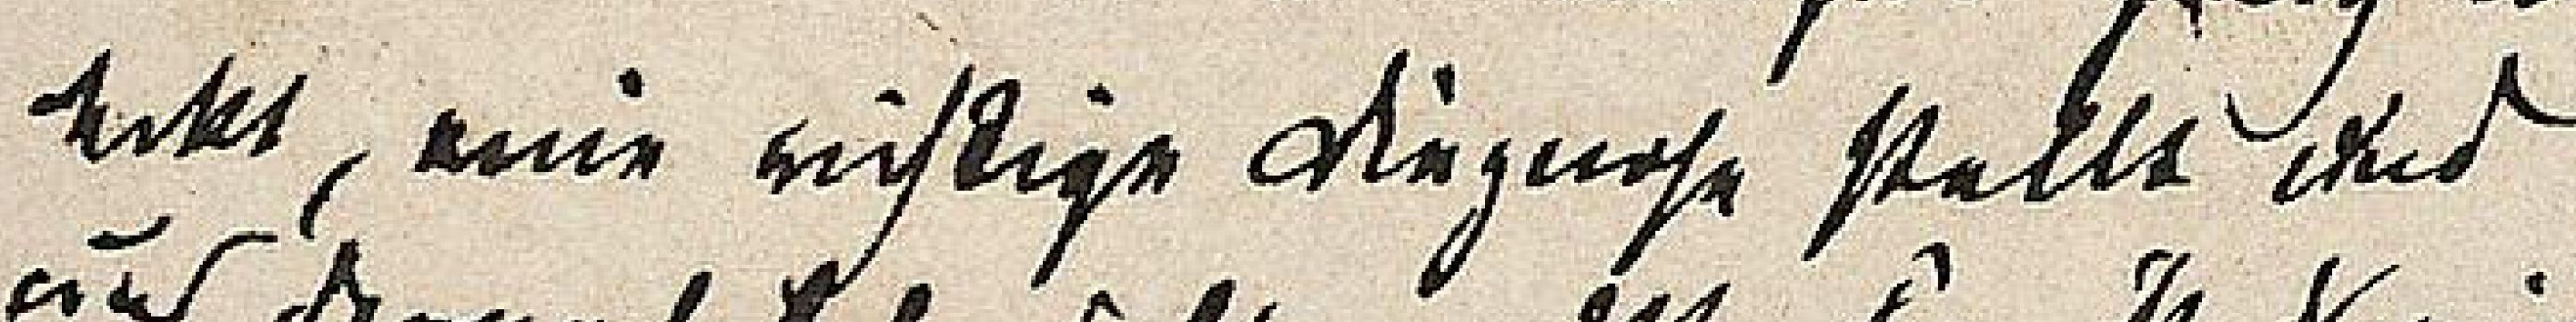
dekt, eine richtige Diagnose stellt und
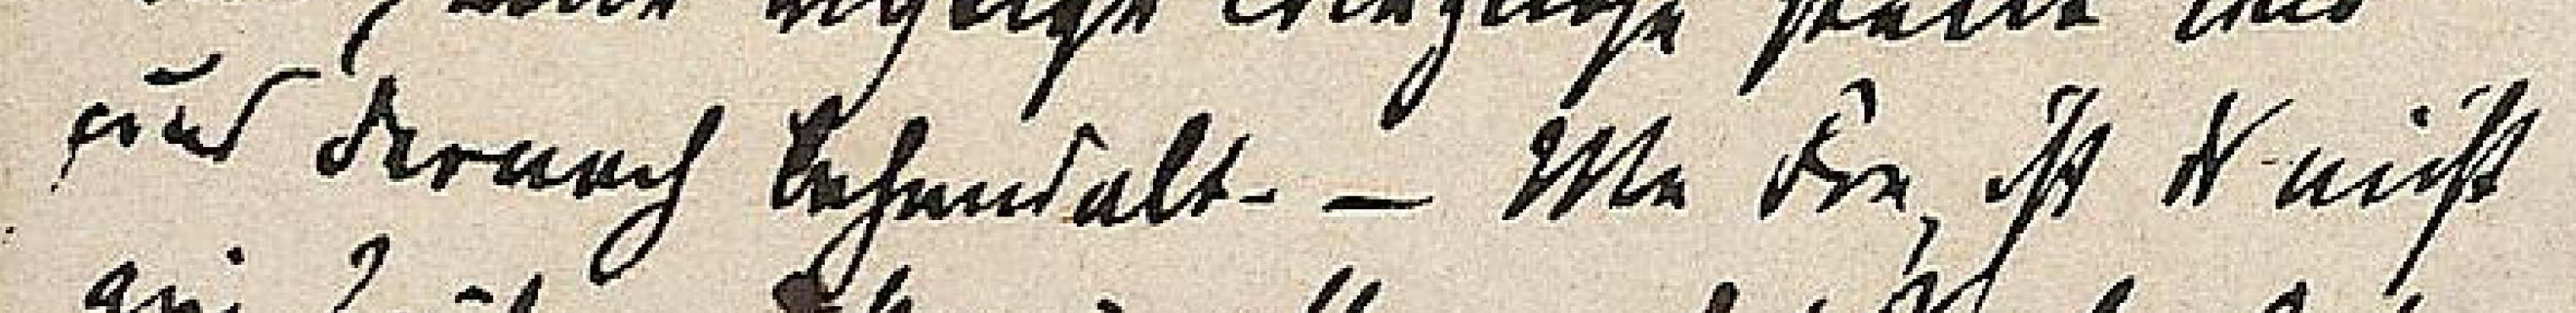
uns dernach behandelt. _ Mn Fr, ist ds nicht
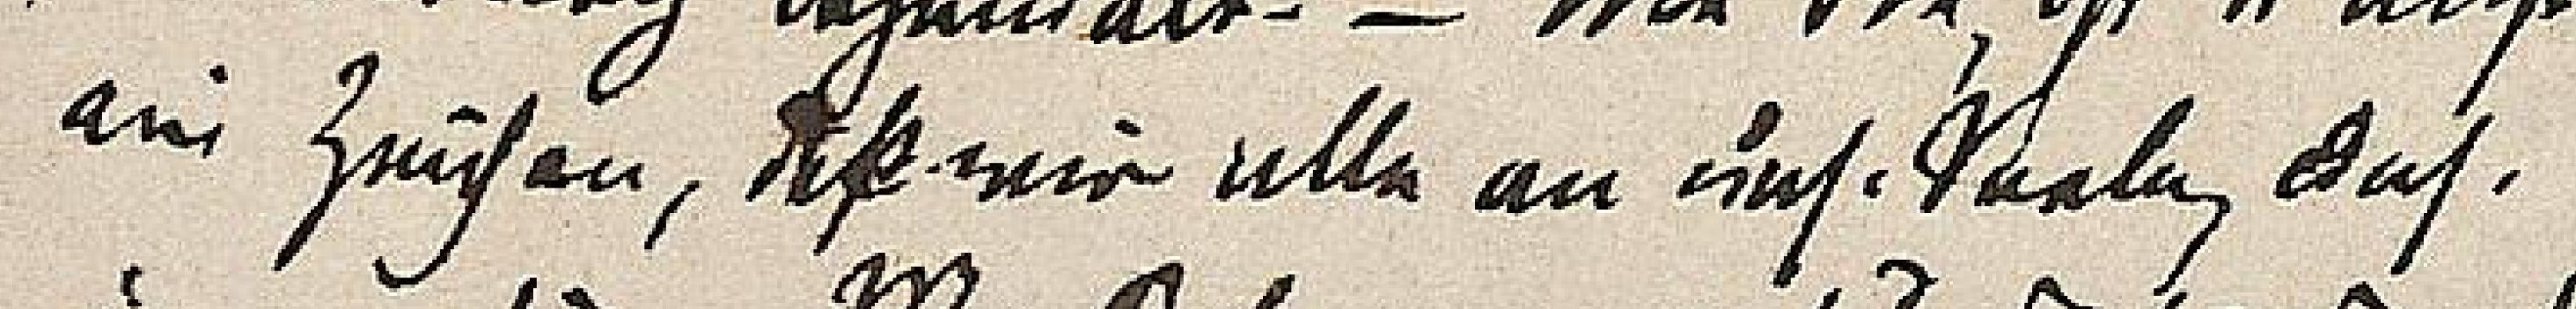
ein Zeichen, daß wie alle an uns. Seele, uns.
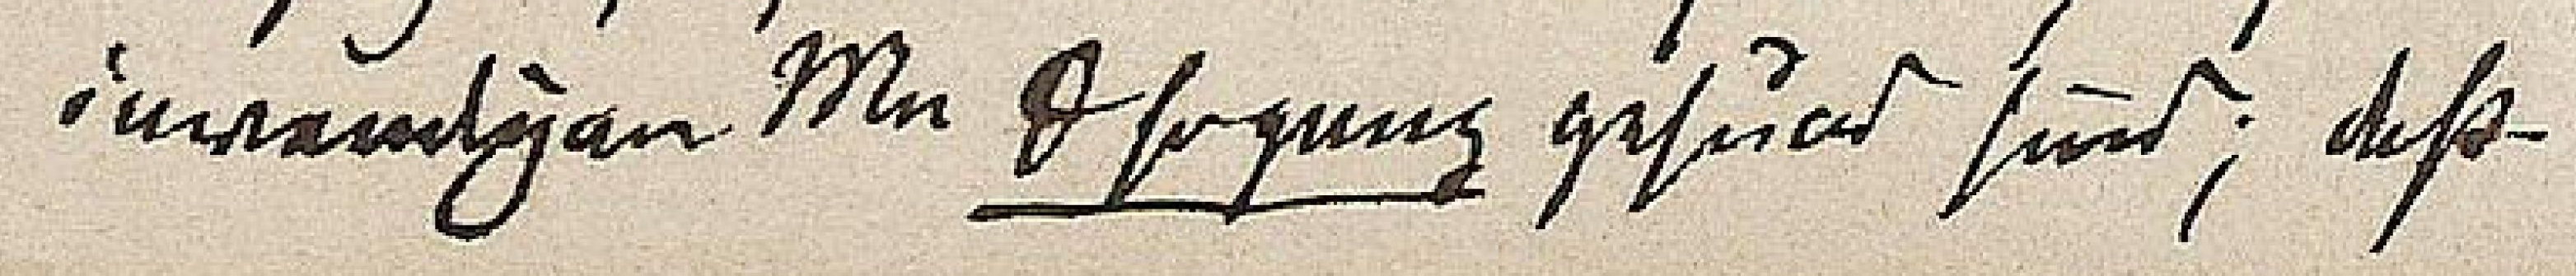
inwendigen Mn. o so ganz gesund sind, daß
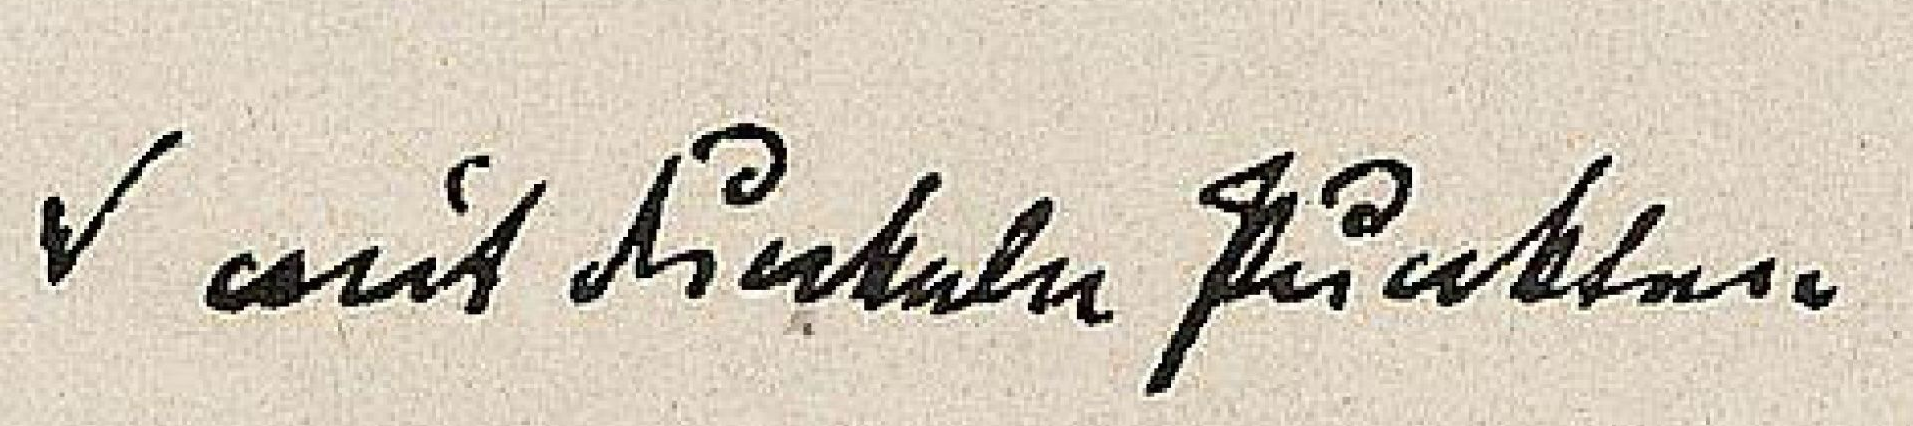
V mit dunkeln Punkten
